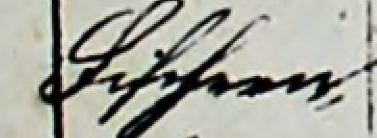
Fischern
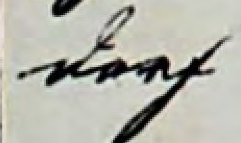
dorf
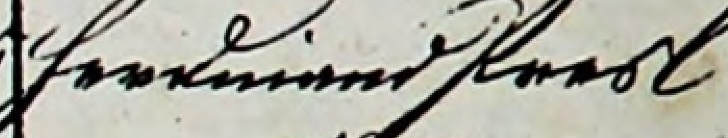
Ferdinand Presl
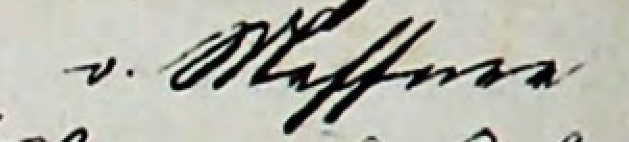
v. Messner
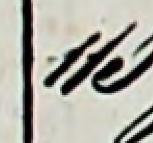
115
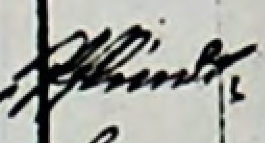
Pflinds„
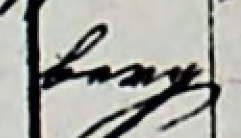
berg
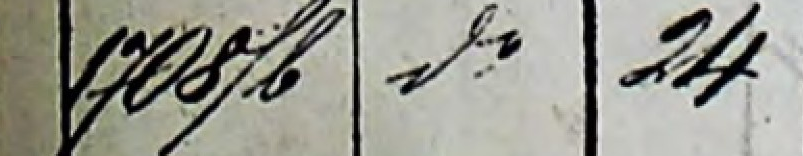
1708/b do 24
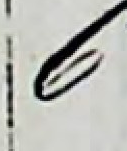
6
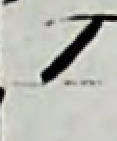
I
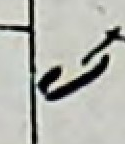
5
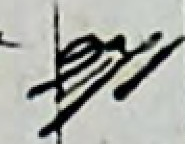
271
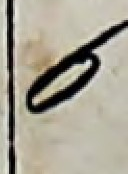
6
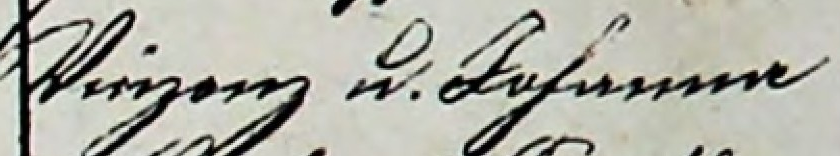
Vinzenz u. Johanna
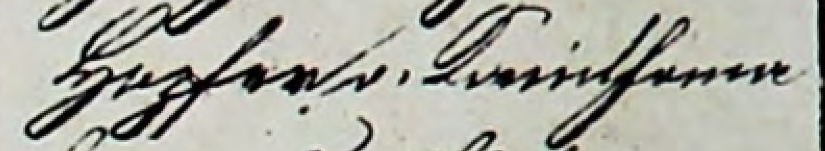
Hopfer v. K???thoma
